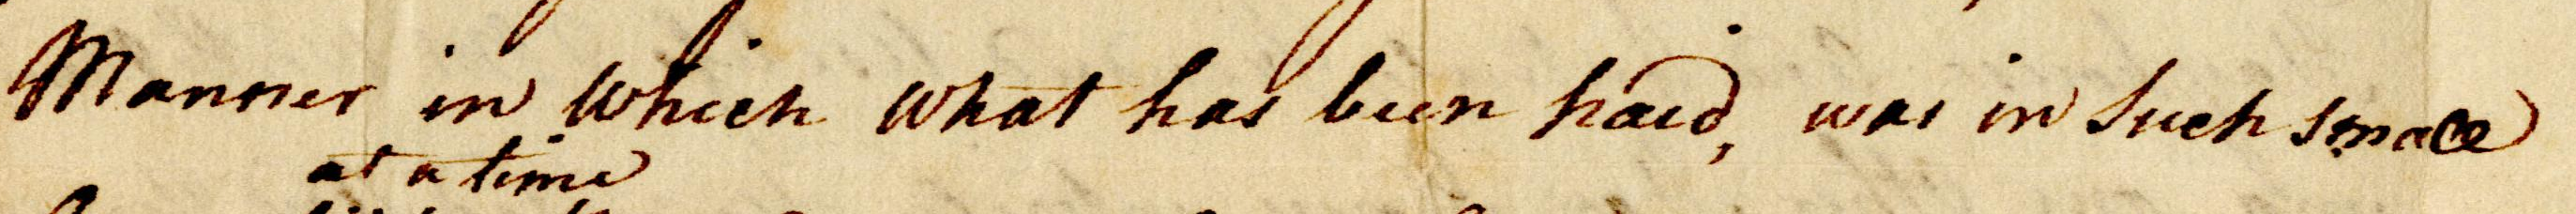Manner in Which what has been paid, was in Such small
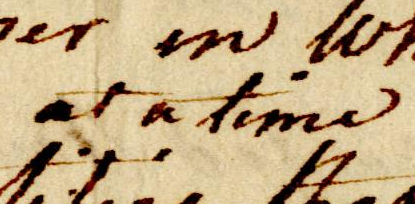at a time
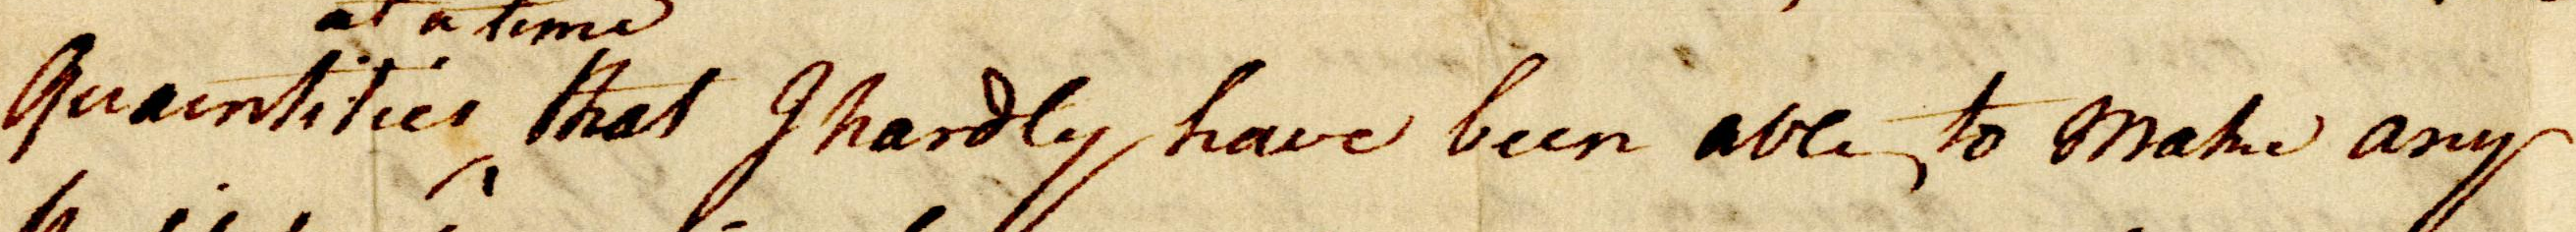quantities that I hardly have been able to make any
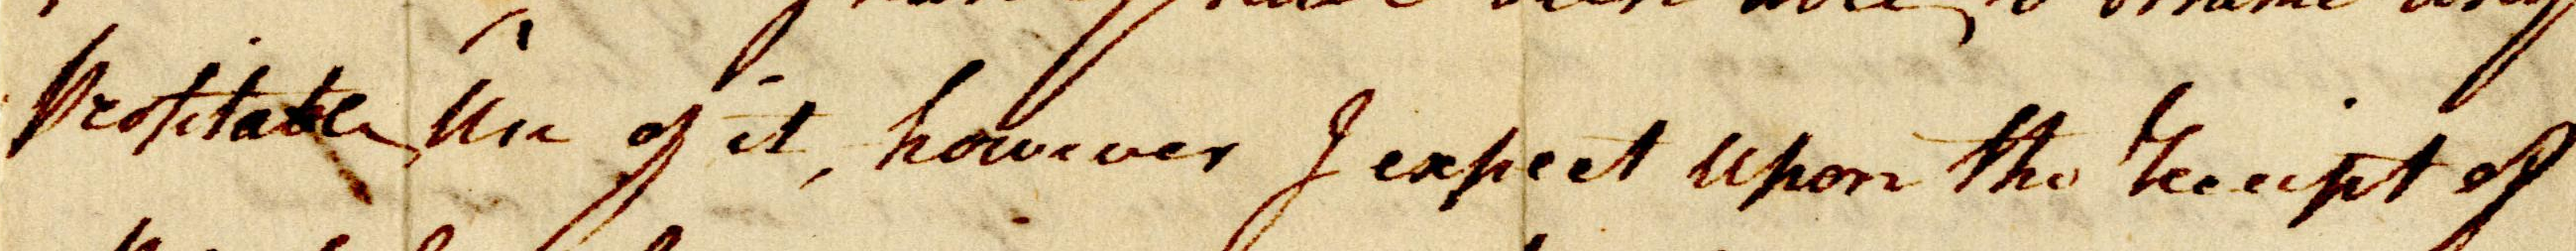profitable Use of it, however I expect upon the receipt of
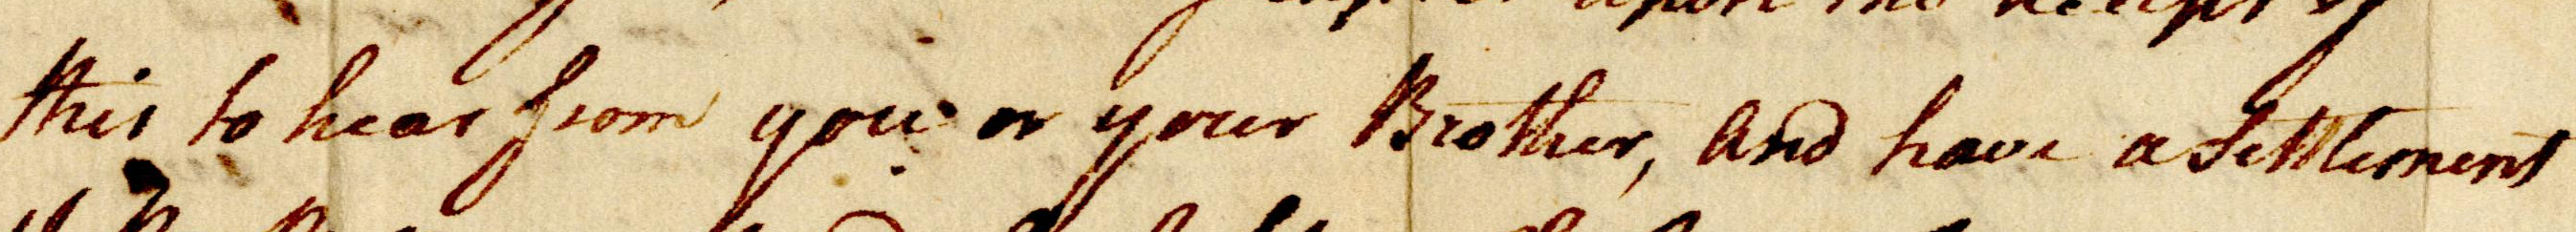this to hear from you or your Brother, and have a Settlement
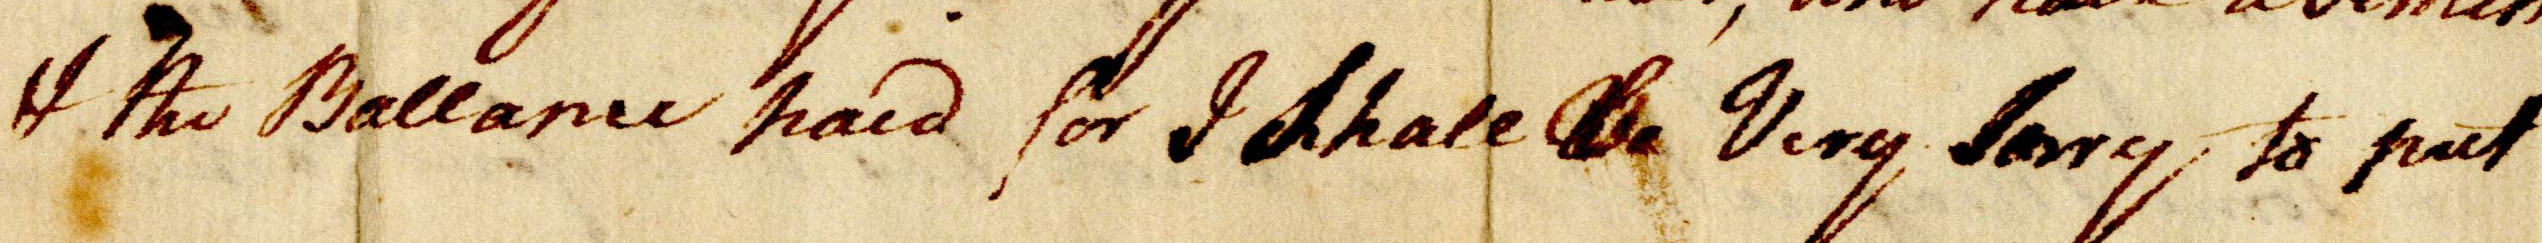& the Ballance paid for I shall be Very Sorry, to part
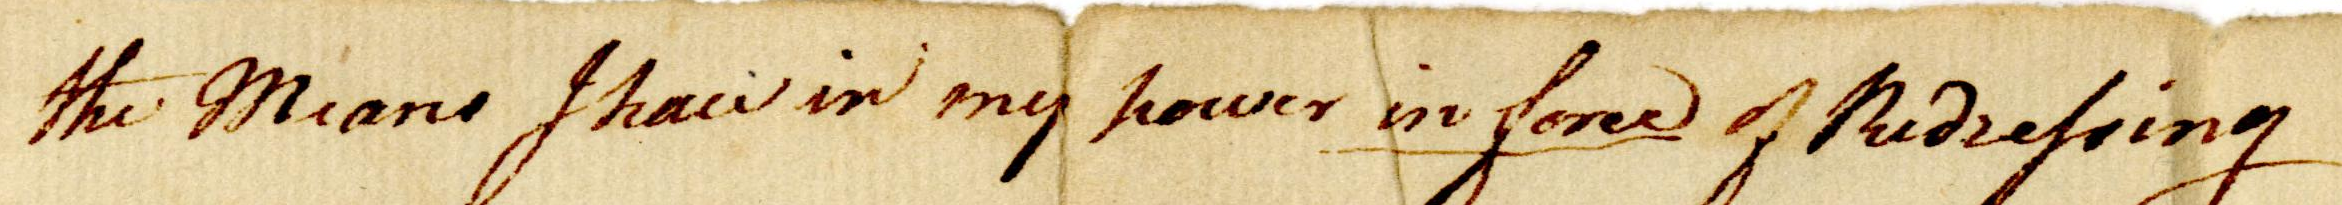the means I have in my power in force of Redressing
